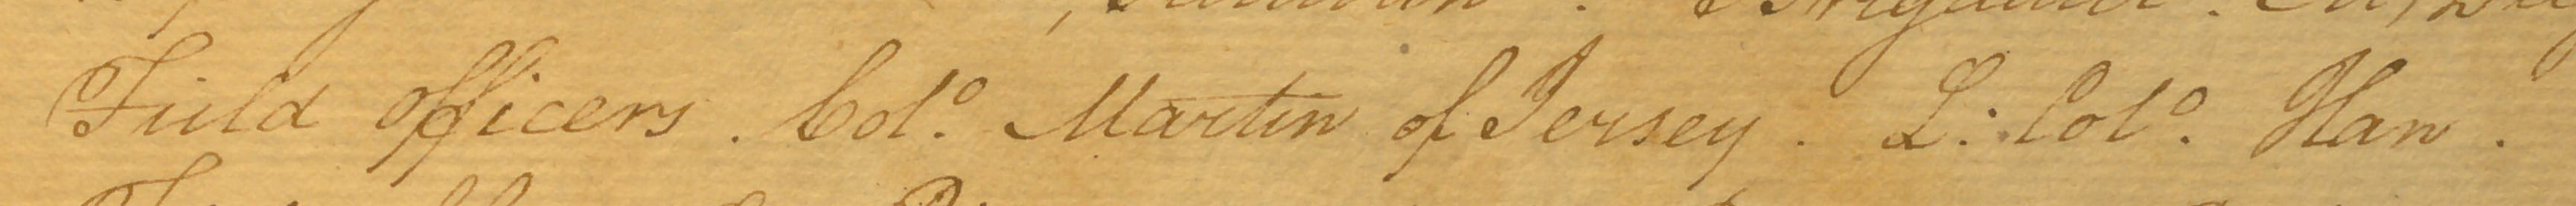Field officers. Col^o. Martin of Jersey. L: Col^o. Han.
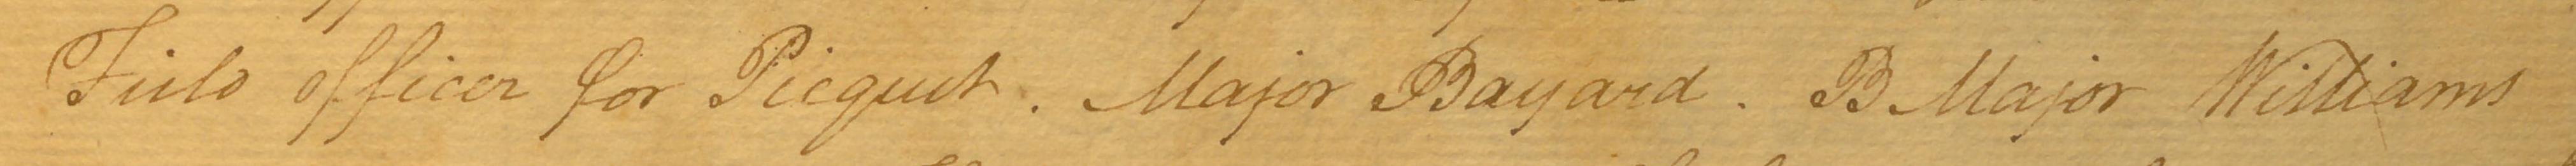Field officer for Picquet. Major Bayard. B Major Williams
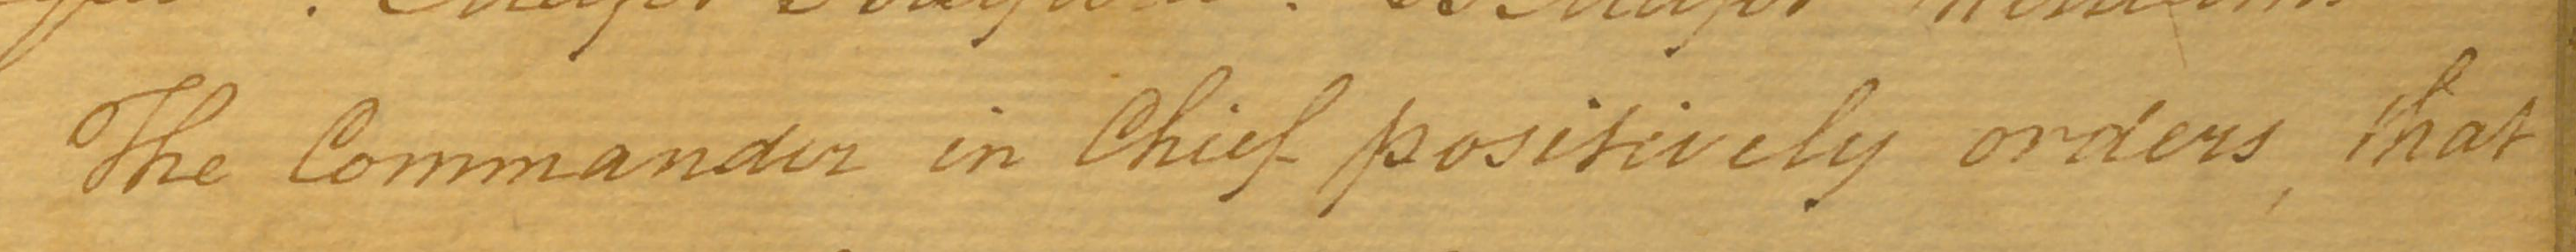The Commander in Chief positively orders that
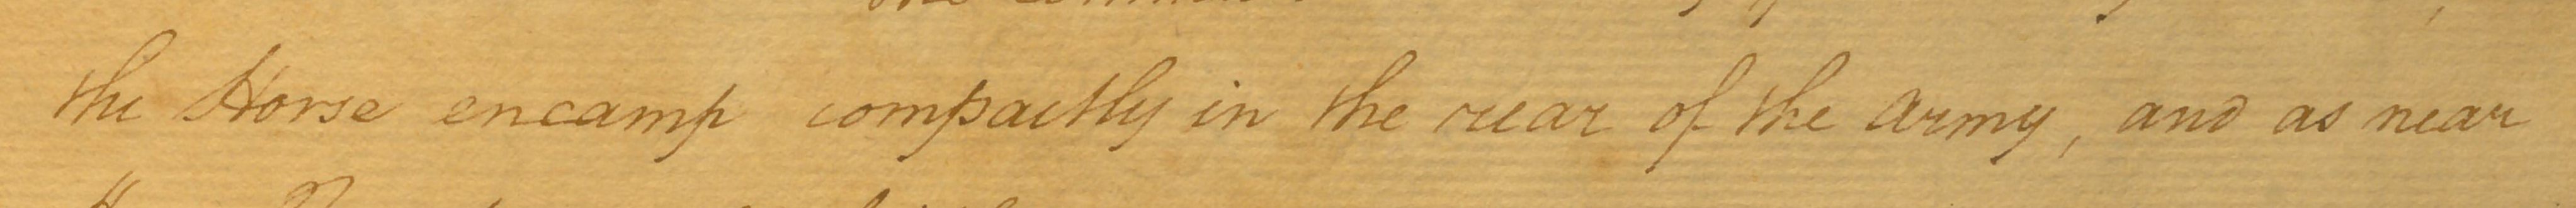the Horse encamp compactly in the rear of the army, and as near
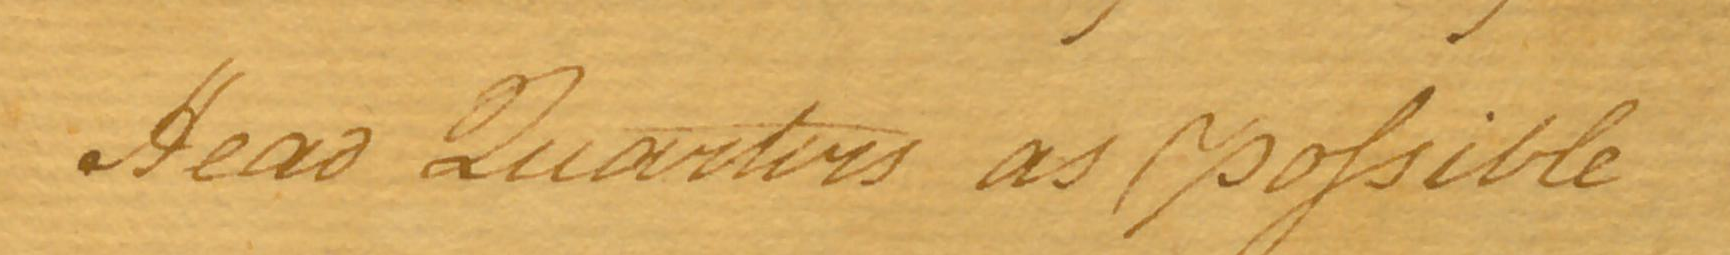Head Quarters as possible
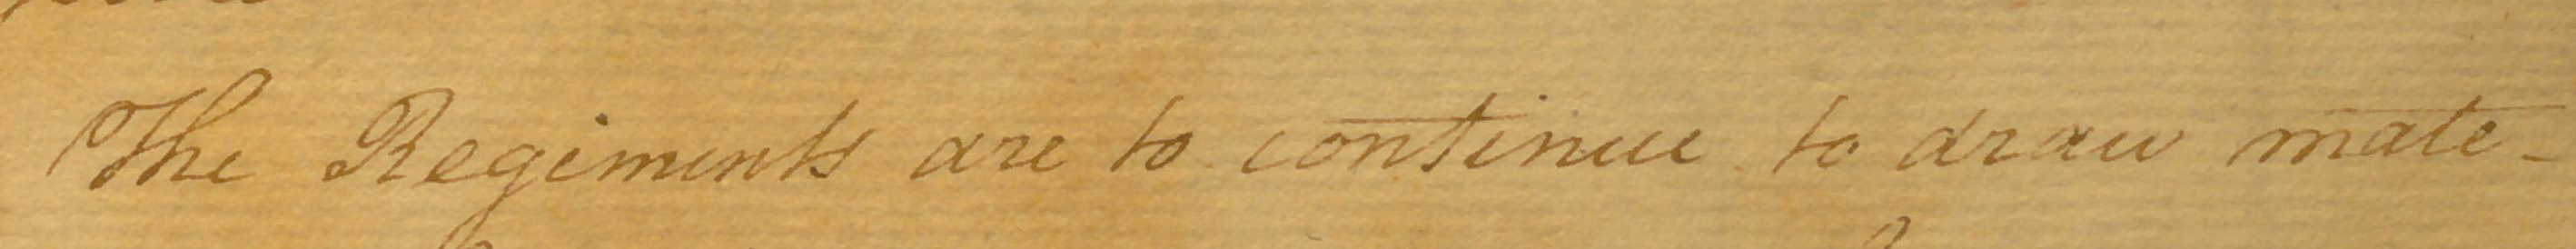The Regiments are to continue to draw mate-
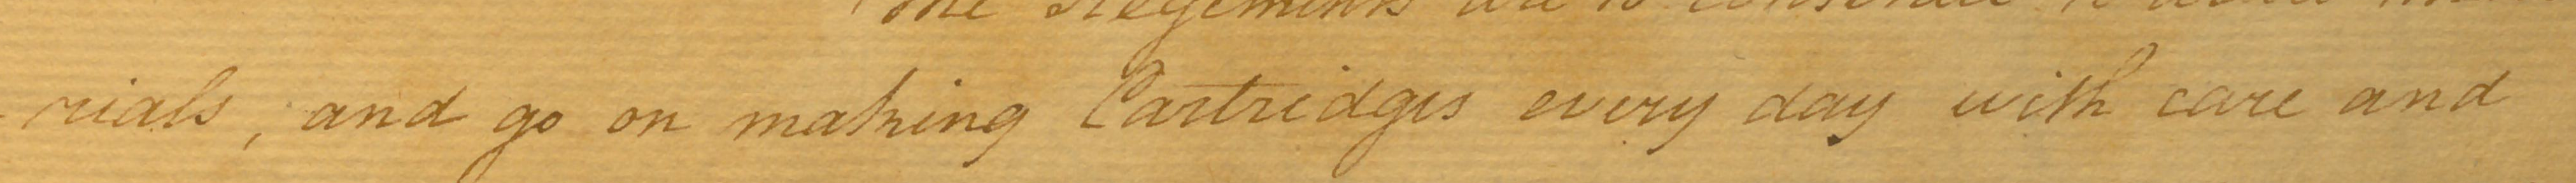rials, and go on making Cartridges every day with care and
